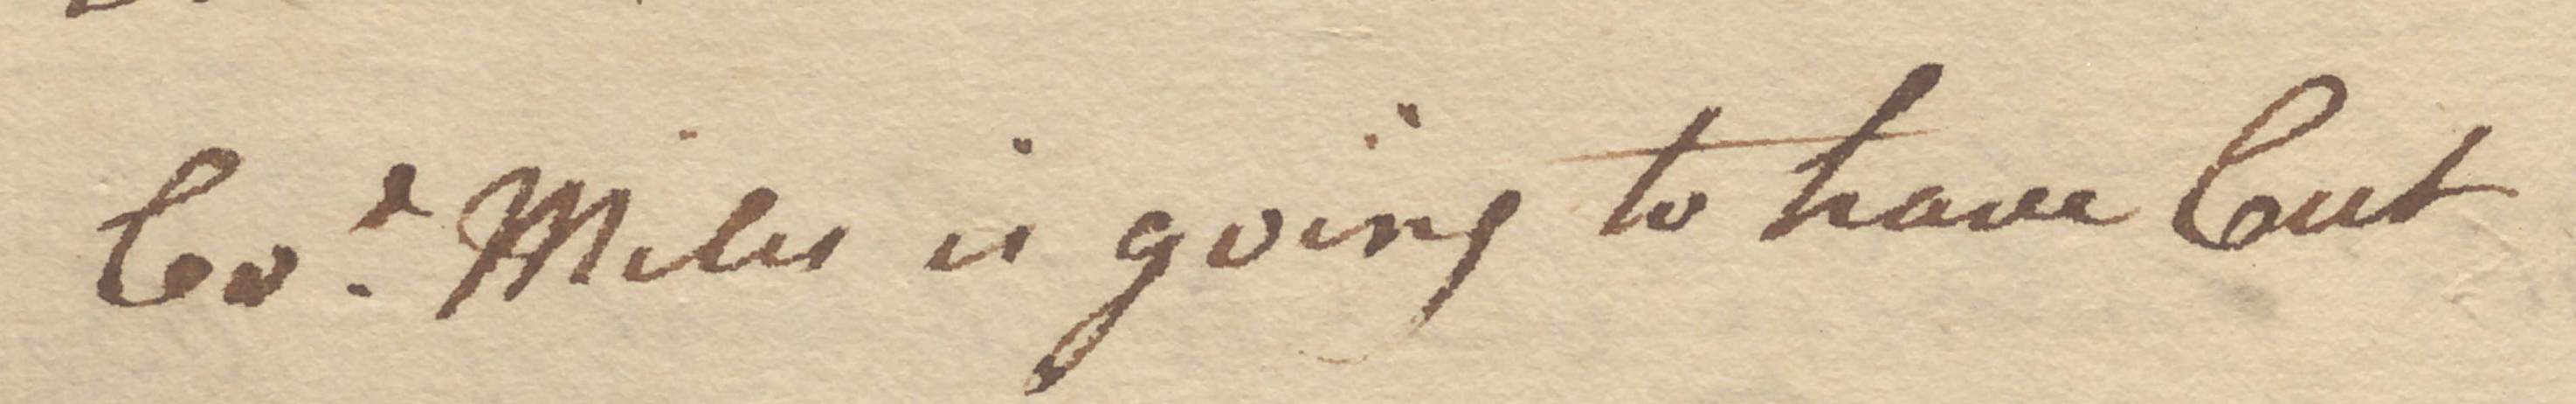Co^l. Miles is going to have Cut
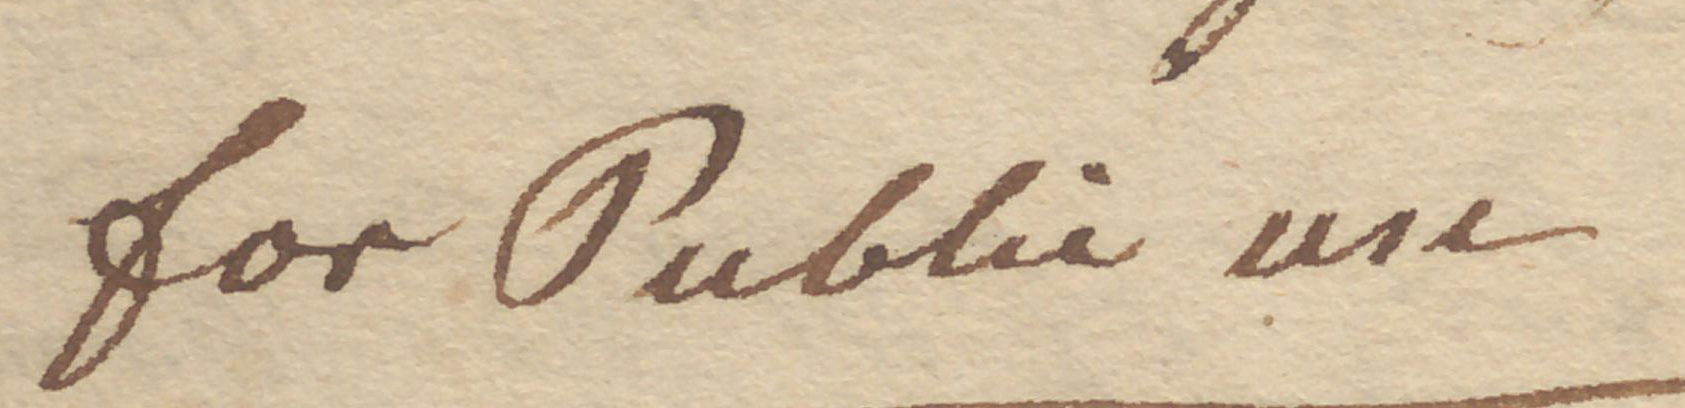for Public use
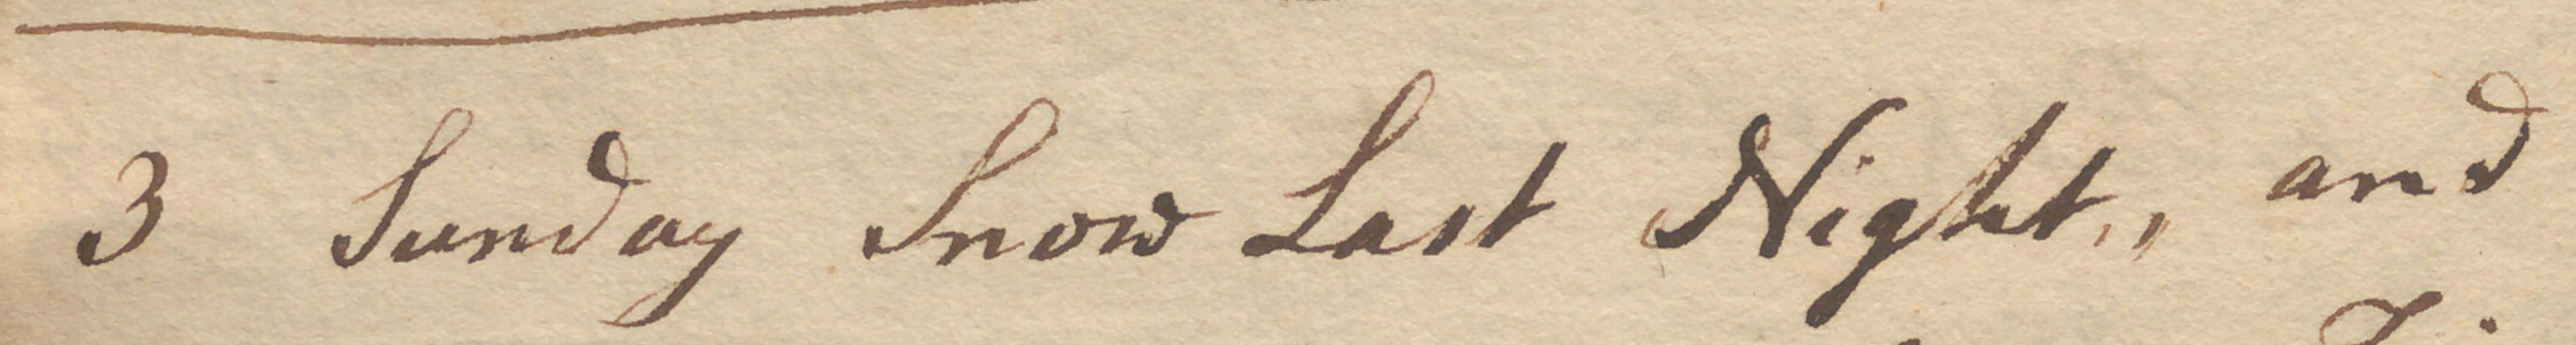3 Sunday Snow Last Night. and
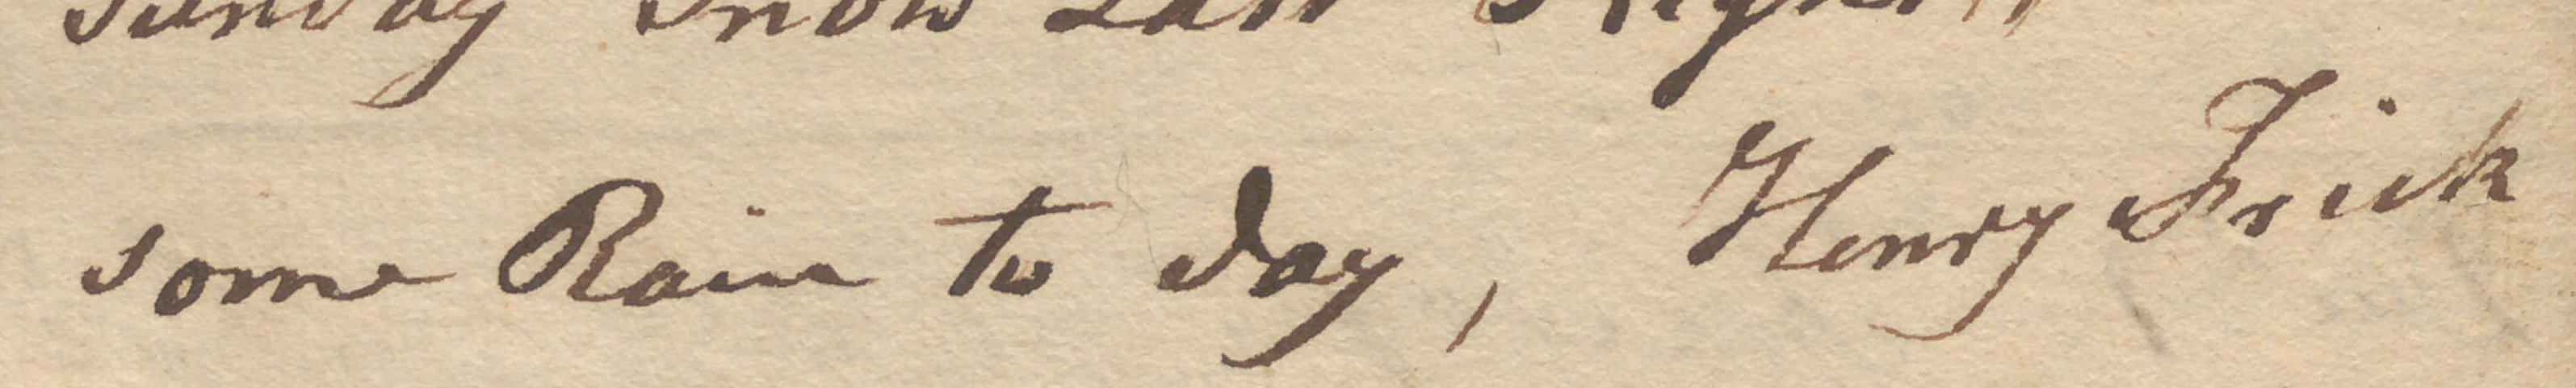some Rain to day, Henry Frick
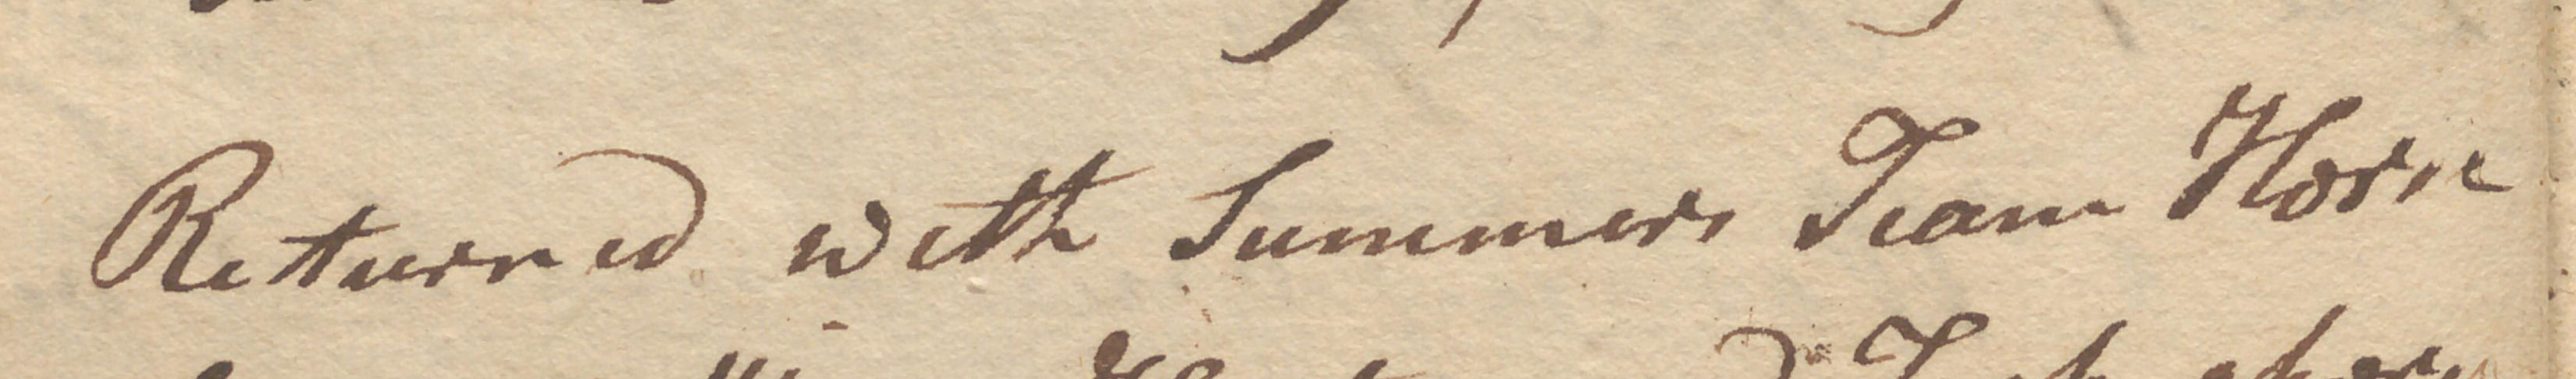Returned with Summers Team Horse
